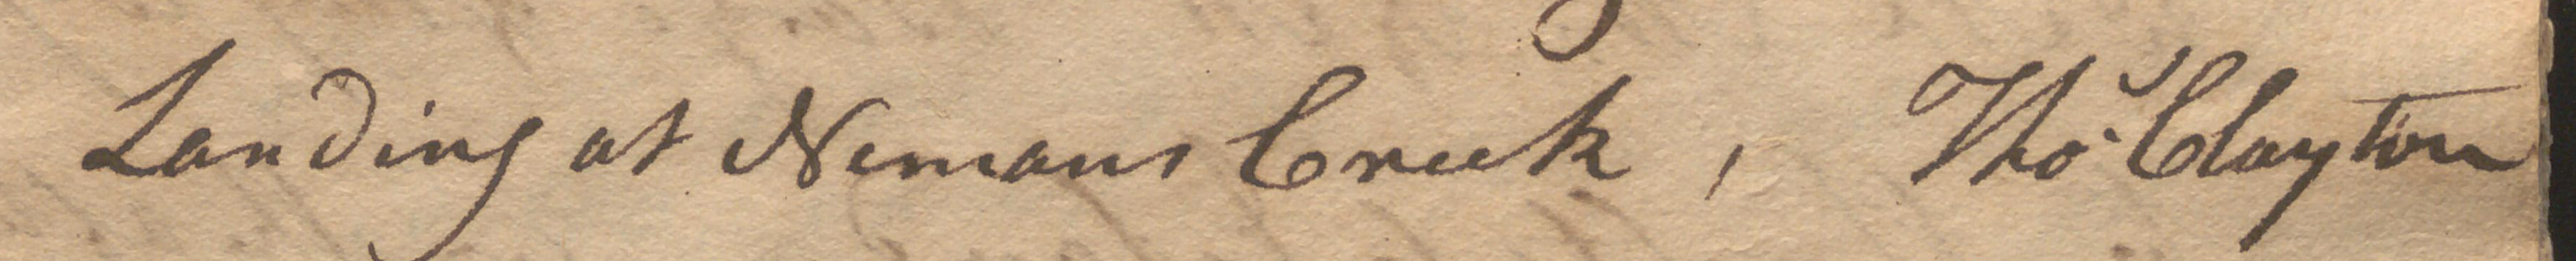Landing at Nemans Creek, Tho^s. Clayton
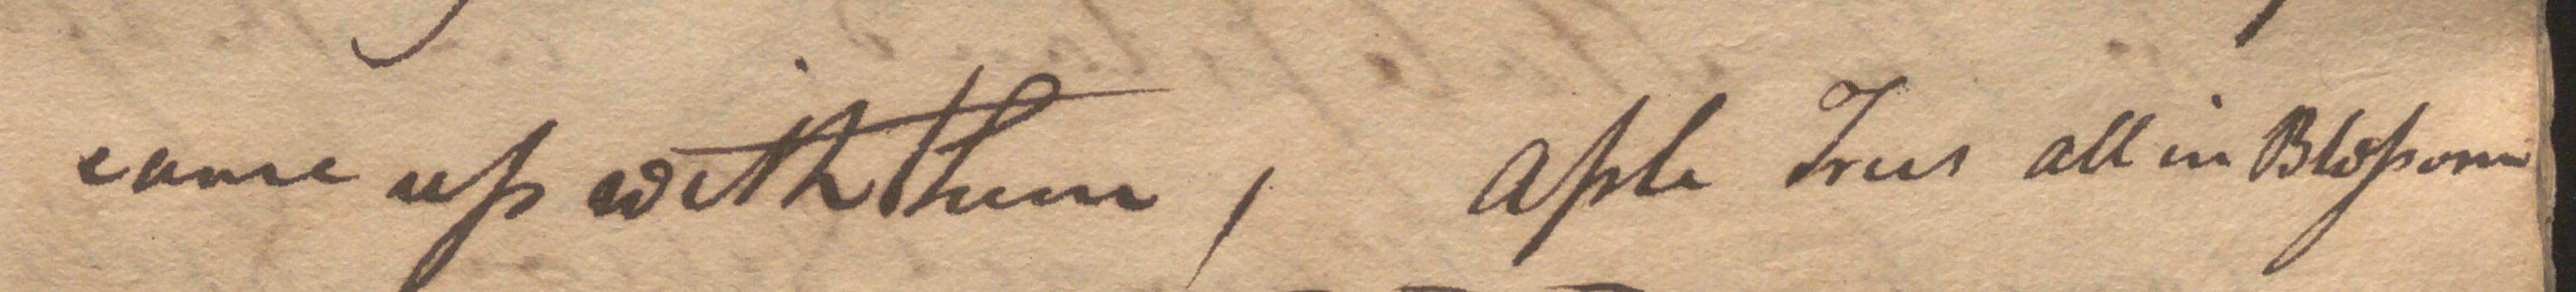came up with them, Aple Trees all in Blossom
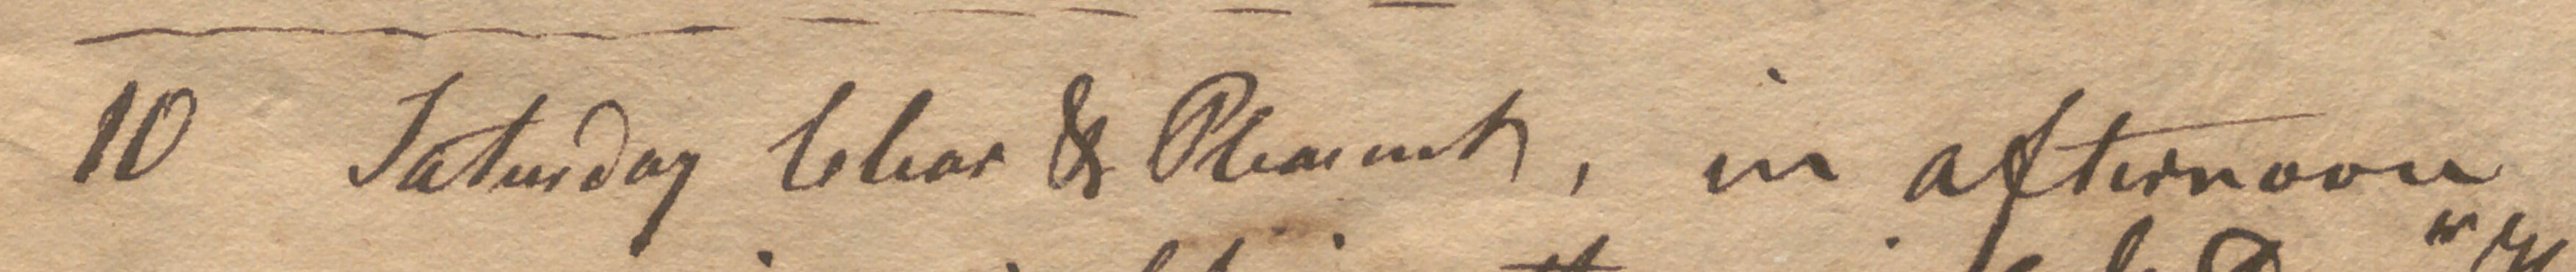10 Saturday Clear & Pleasent, in afternoon
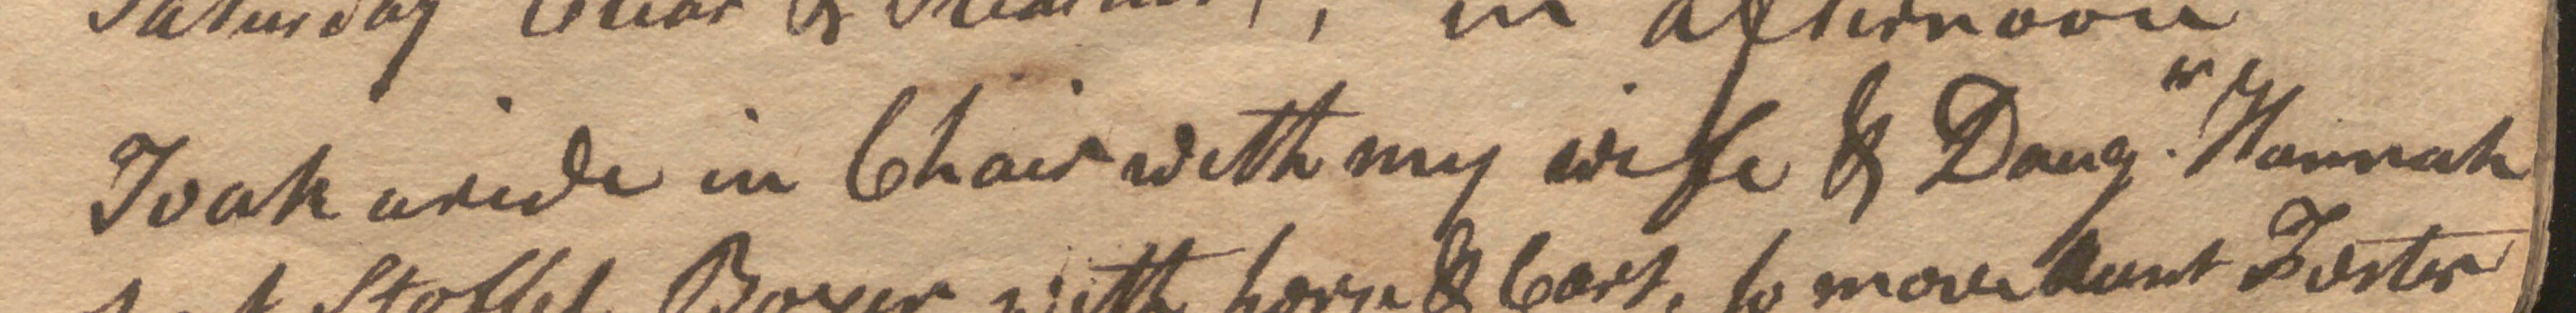Toak a ride in Chair with my wife & Daug^r. Hannah
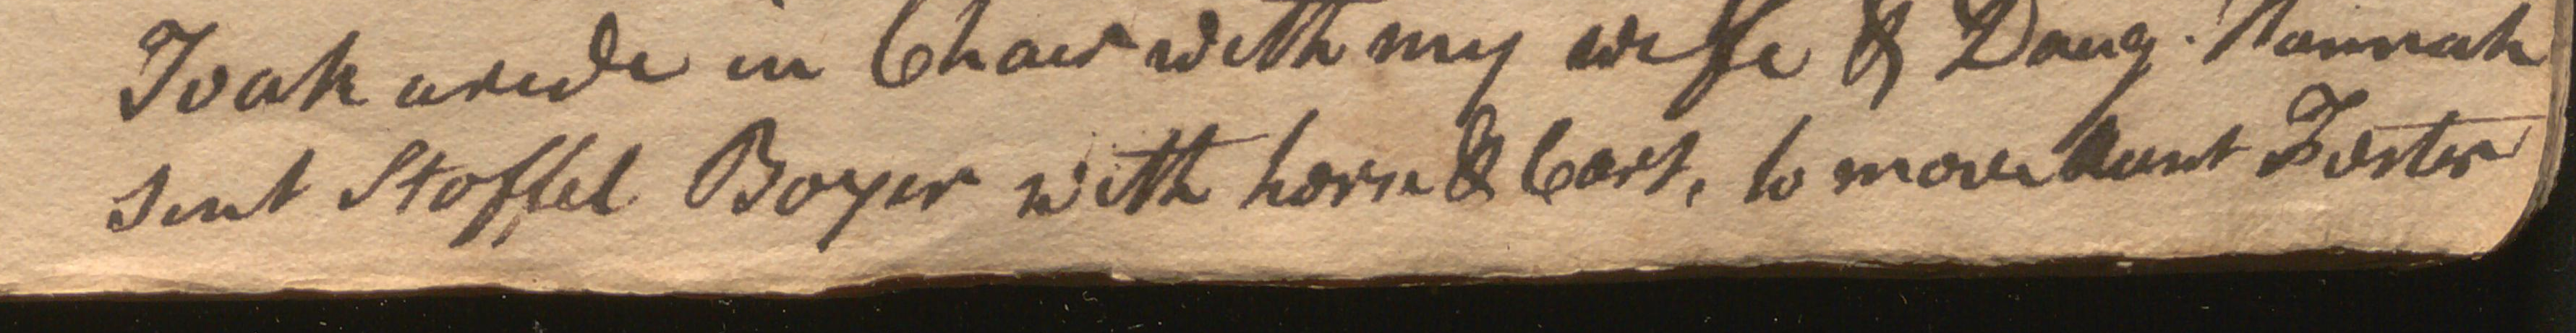sent Stoffel Boyer with horse & Cart, to move Aunt Foster
